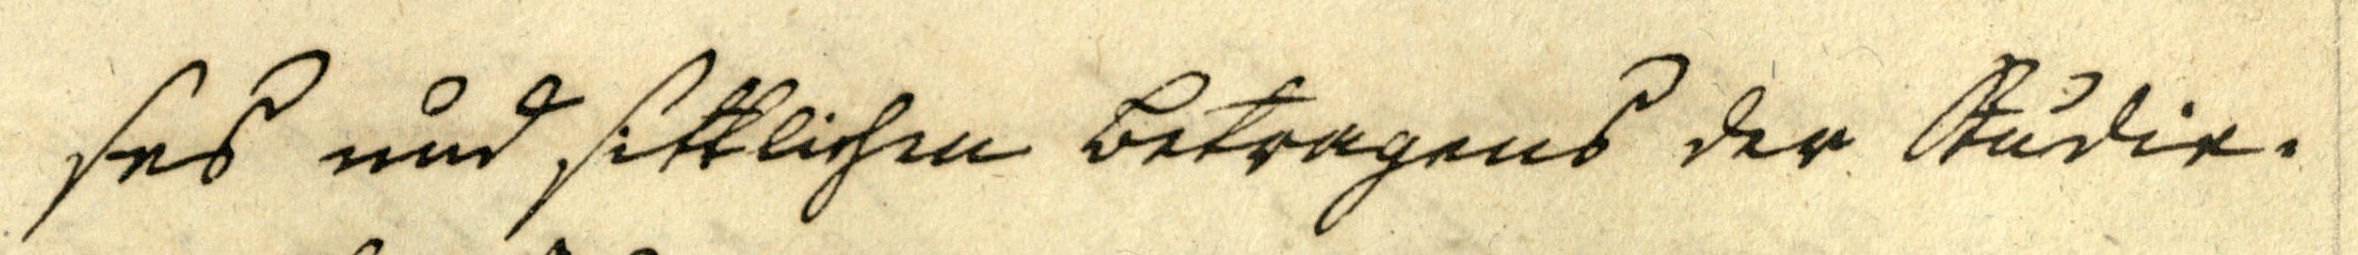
ses und sittlichen Betragens der Studie¬
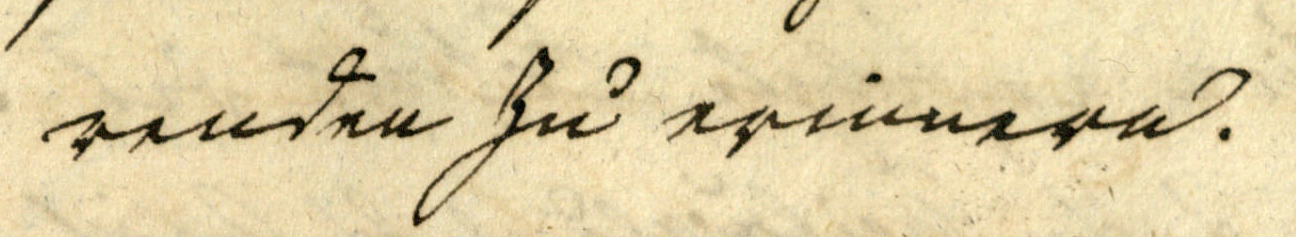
renden zu erinnern.
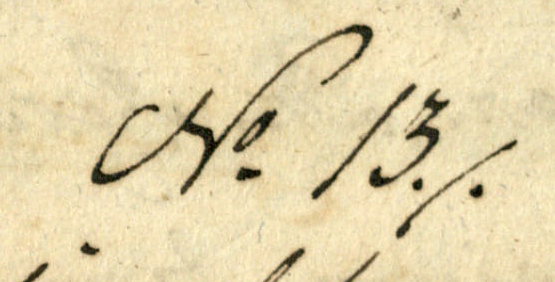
No 13.
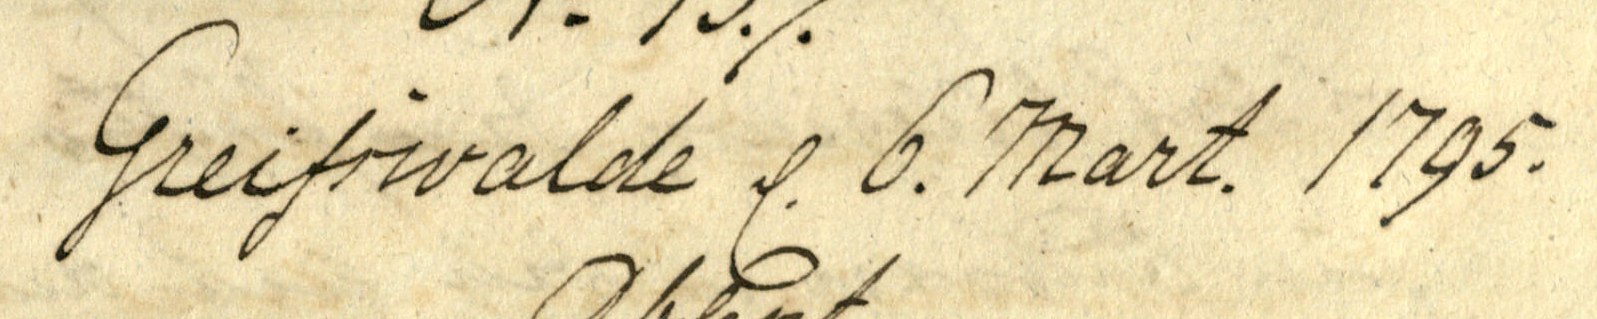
Greifswalde d. 6. Mart. 1795.
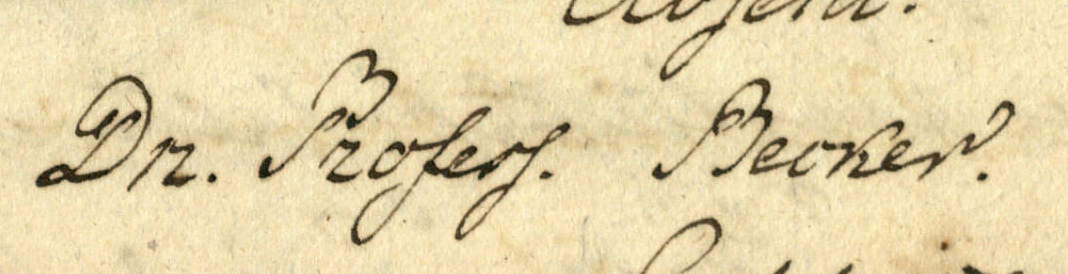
Dn. Profess. Becker.
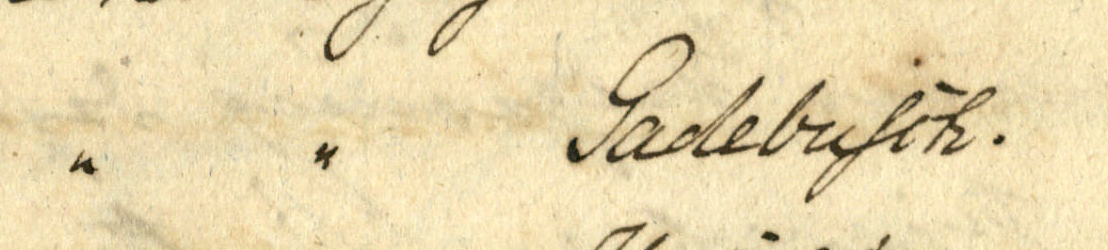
Gadebusch.
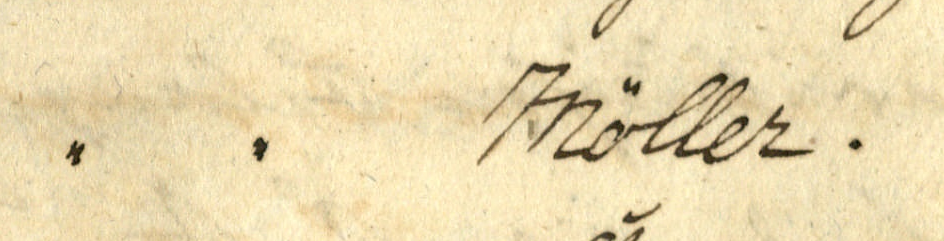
Möller.
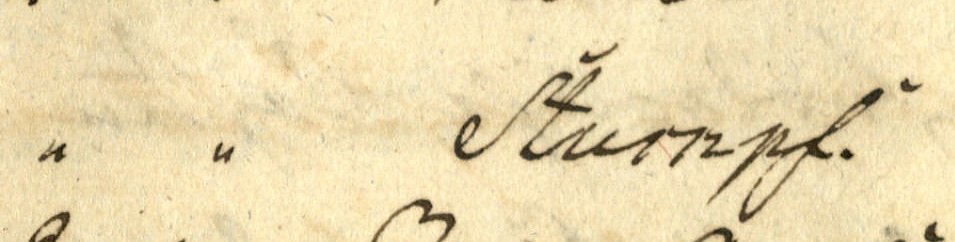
Stumpf.
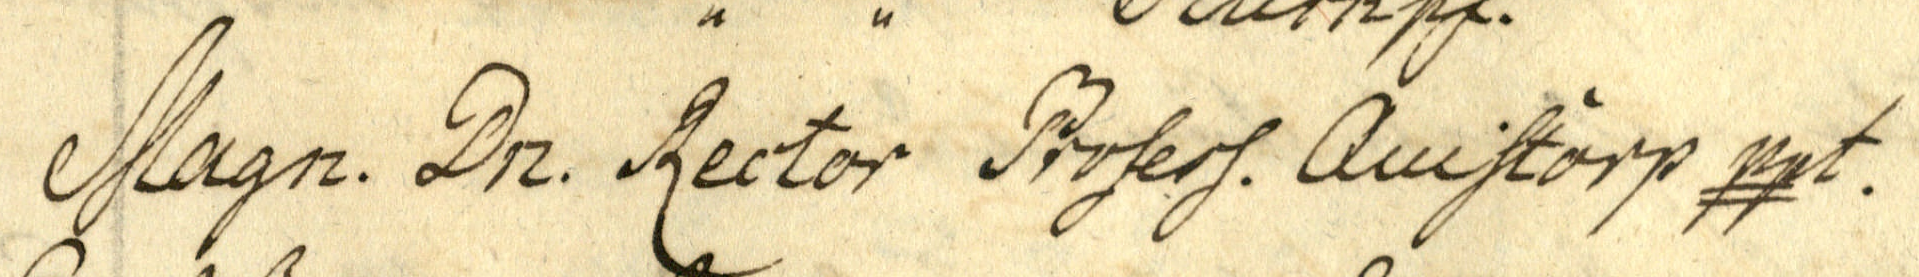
Magn. Dn. Rector Profess. Quistorp ppt.
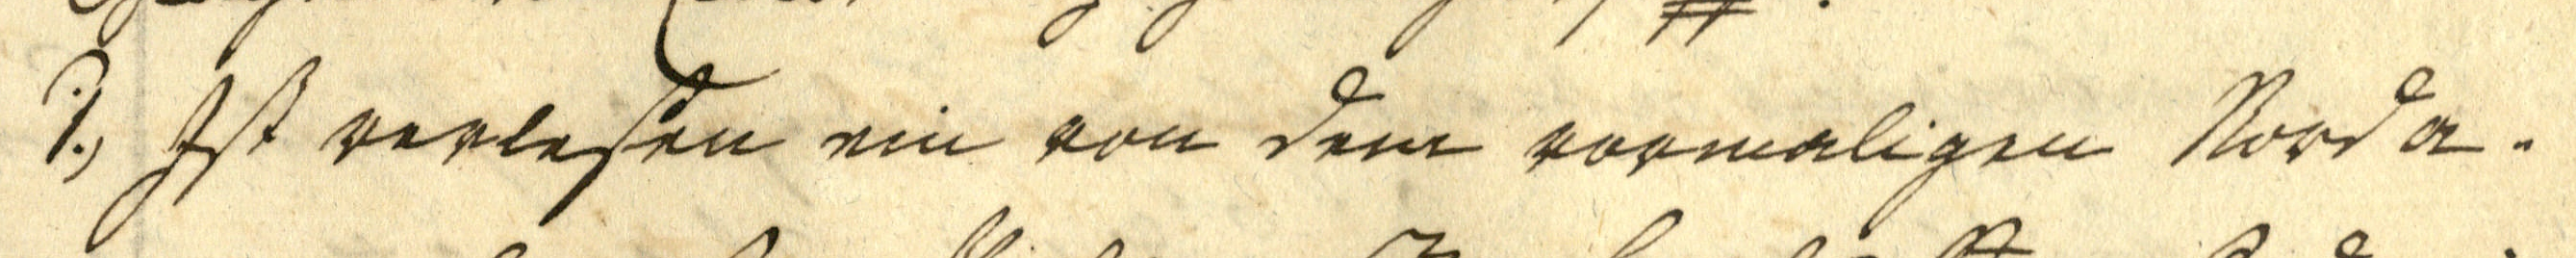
1., Ist verlesen ein von dem vormaligen Norda¬
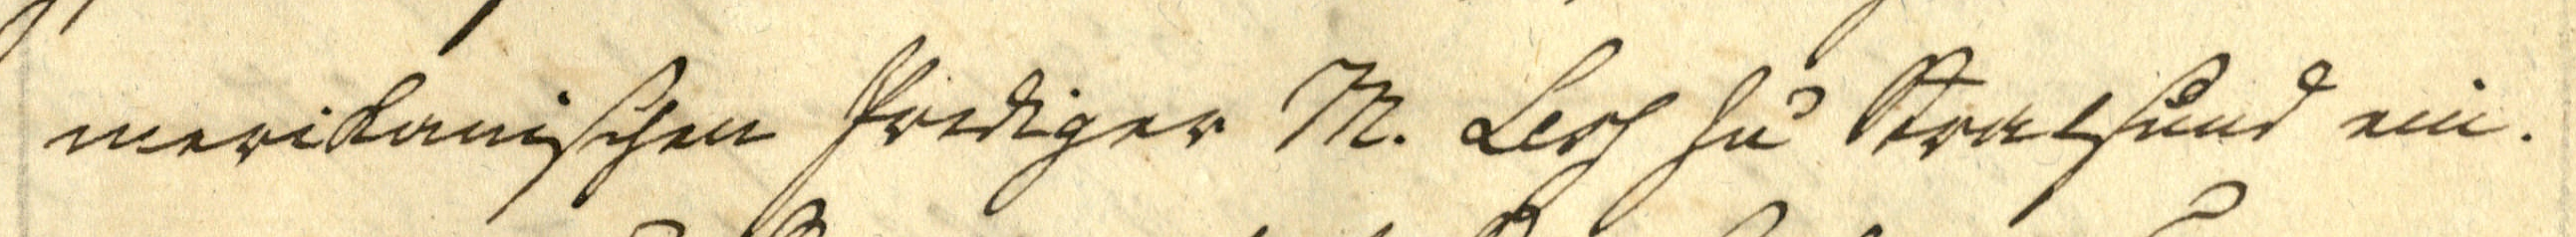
merikanischen Prediger M. Less zu Stralsund ein¬
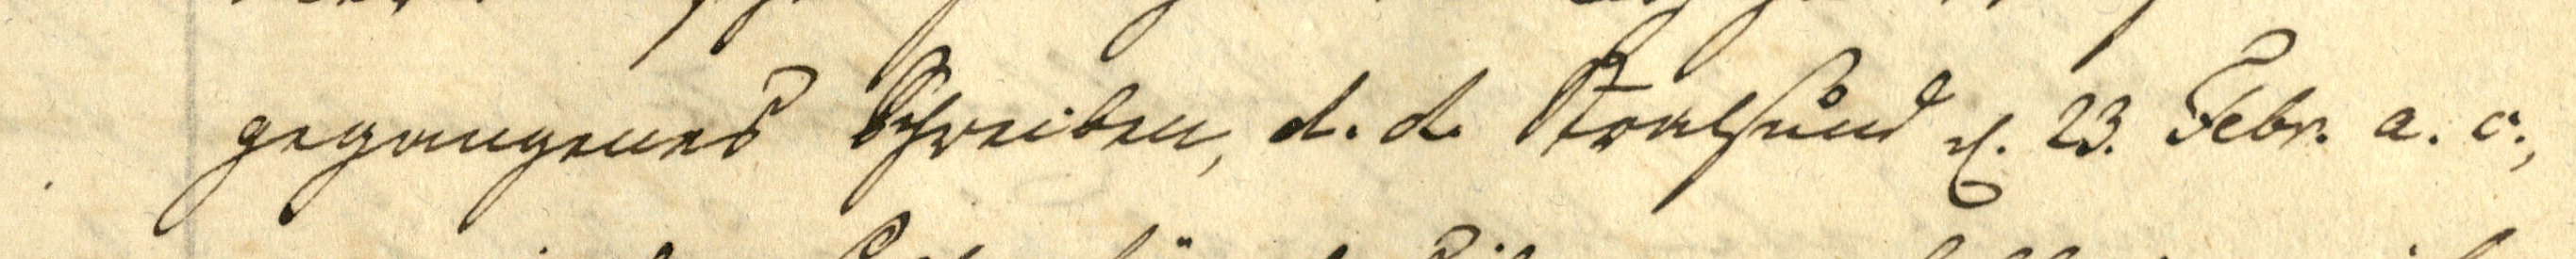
gegangenes Schreiben, d.d . Stralsund d. 23. Febr. a. c.,
